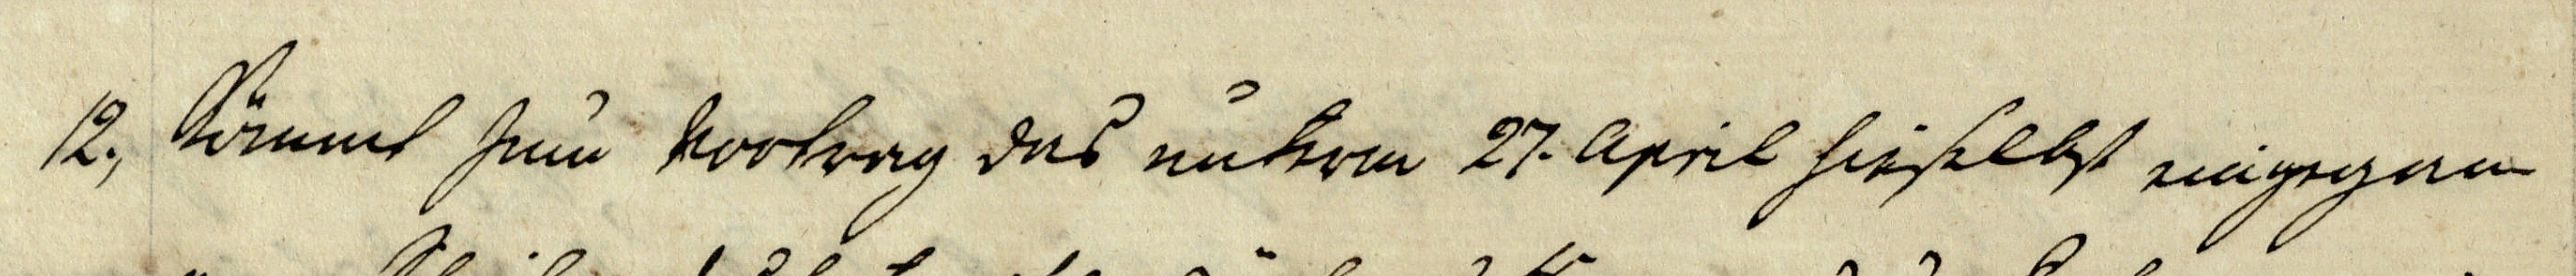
12., Kömmt zum Vortrag das unterm 27. April hieselbst eingegan¬
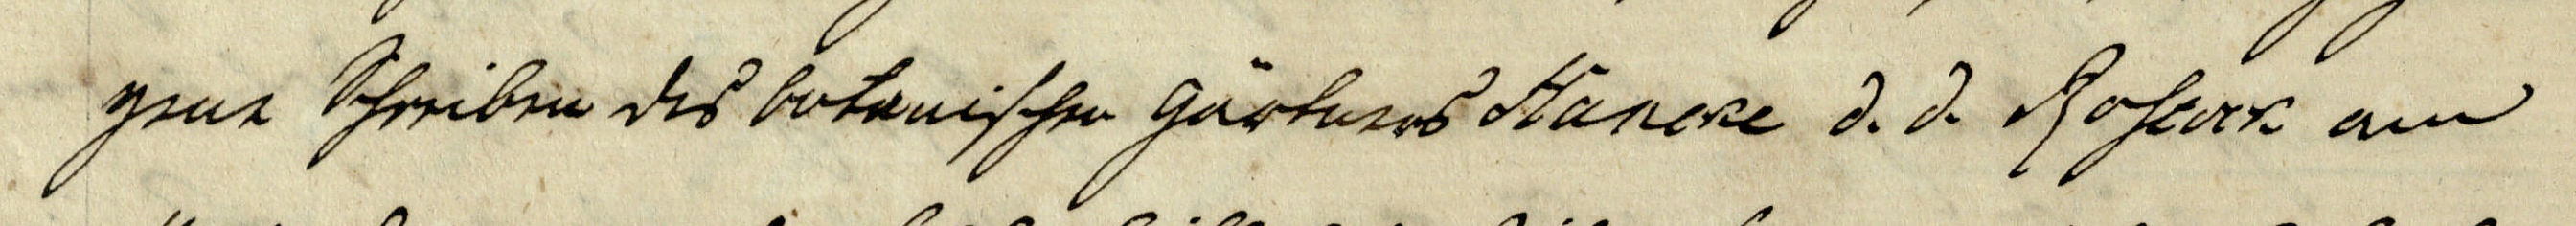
gene Schreiben des botanischen Gärtners Hancke d. d. Rostock am
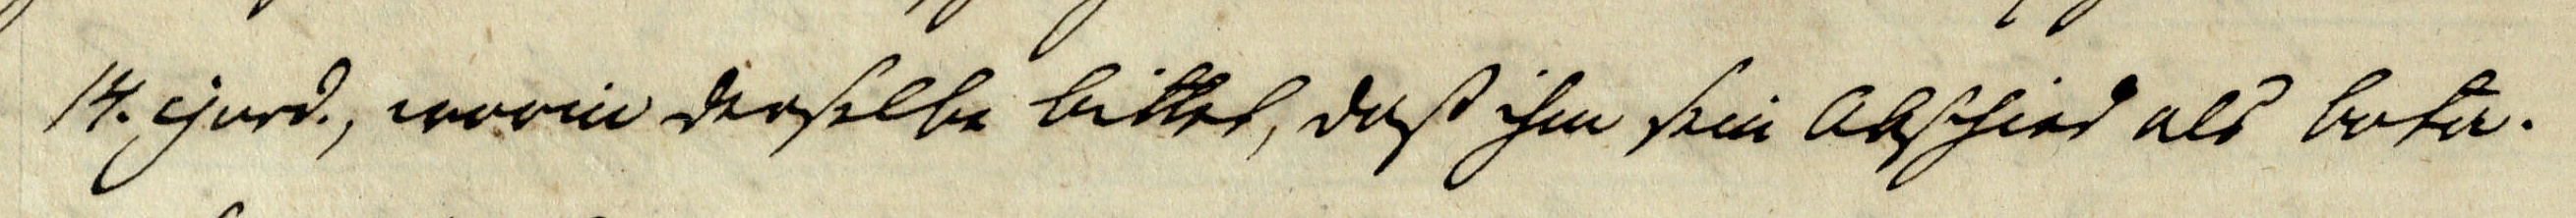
14. ejusd., worin derselbe bittet, daß ihm sein Abschied als bota¬
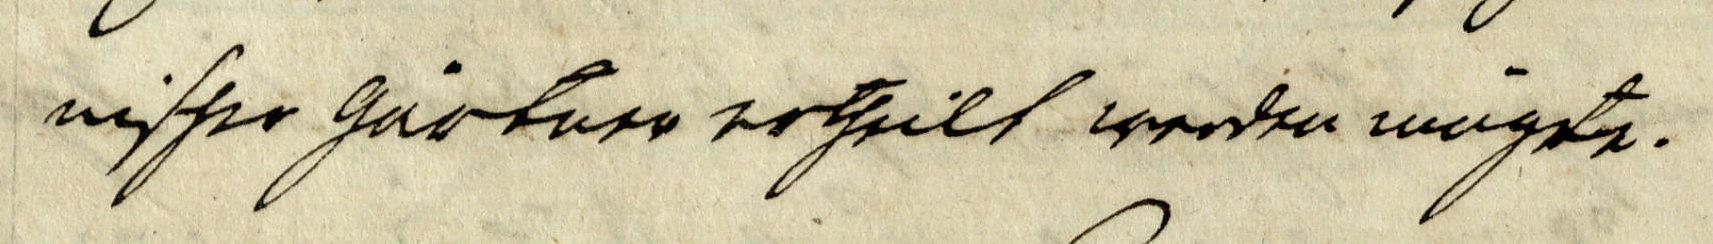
nischen Gärtner ertheilt werden mögte.
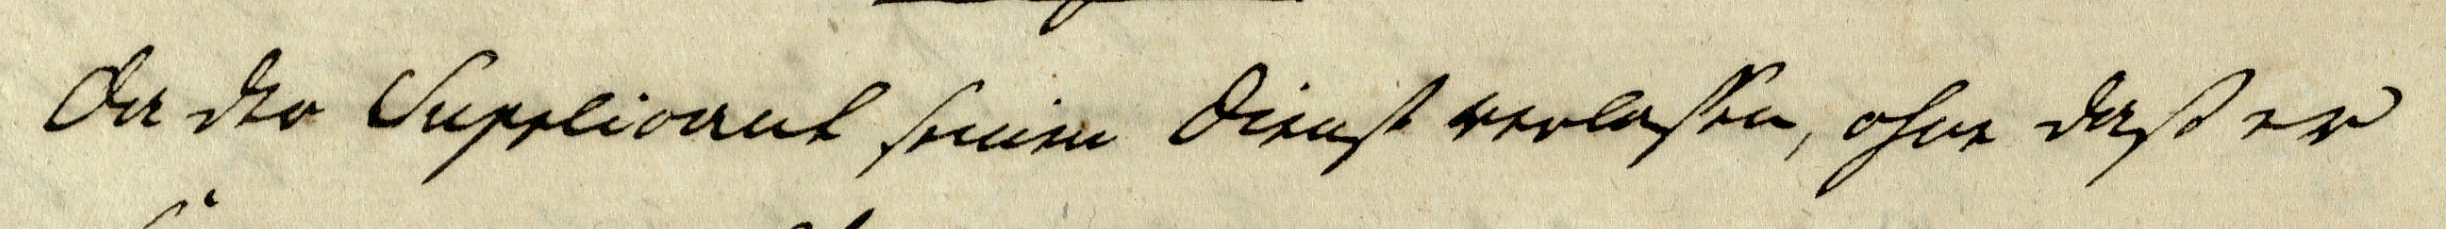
Da der Supplicant seinen Dienst verlassen, ohne daß er
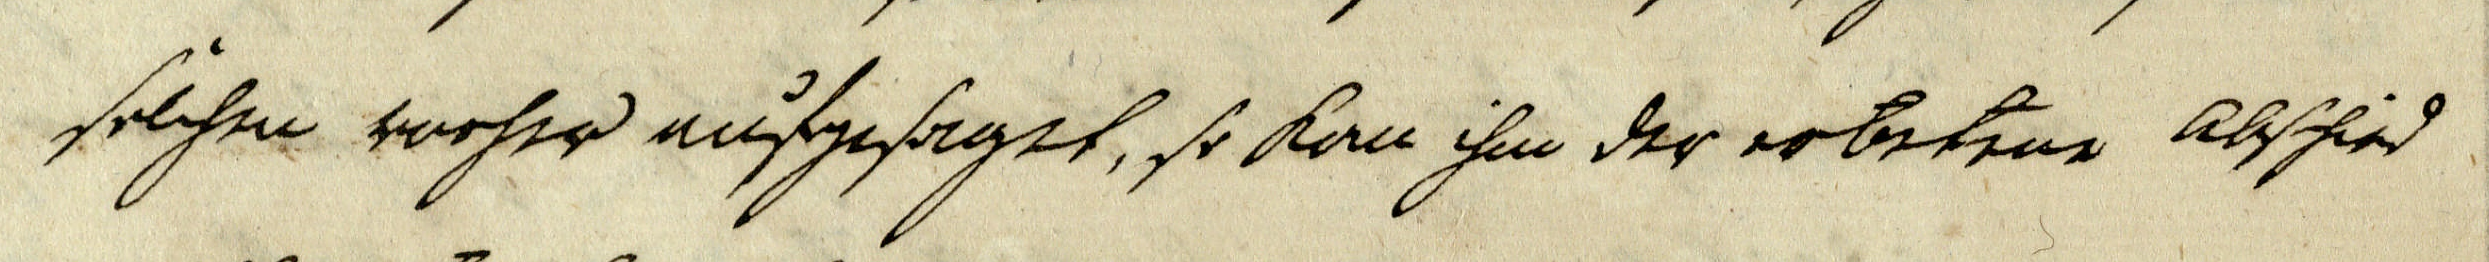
solchen vorher aufgesaget, so kan ihm der erbetene Abschied
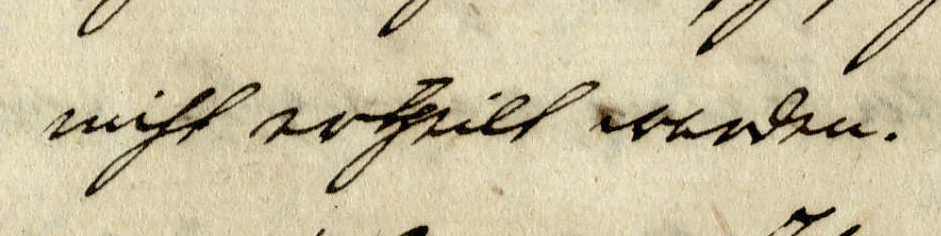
nicht ertheilt werden.
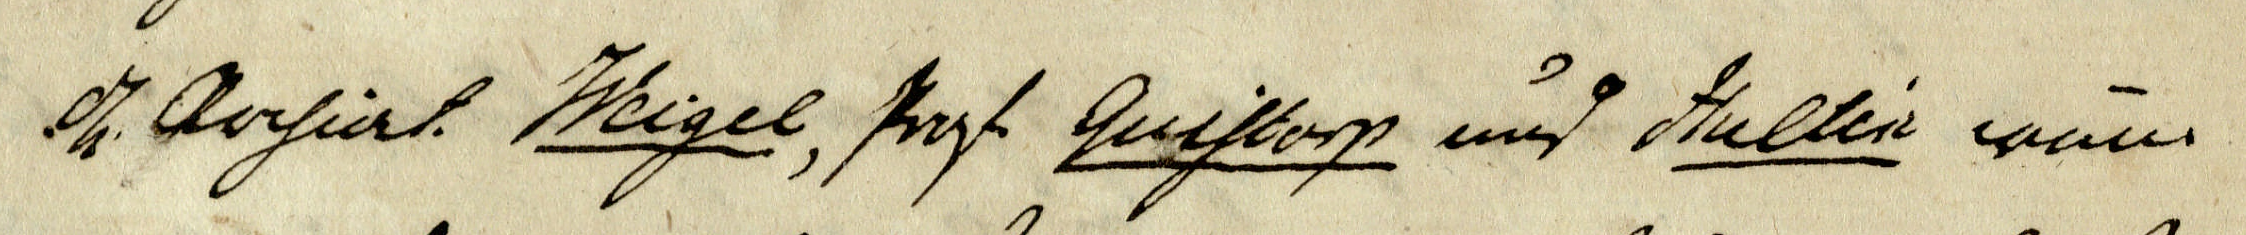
dh. Archiat Weigel, Prof. Quistorp und Hultén wün¬
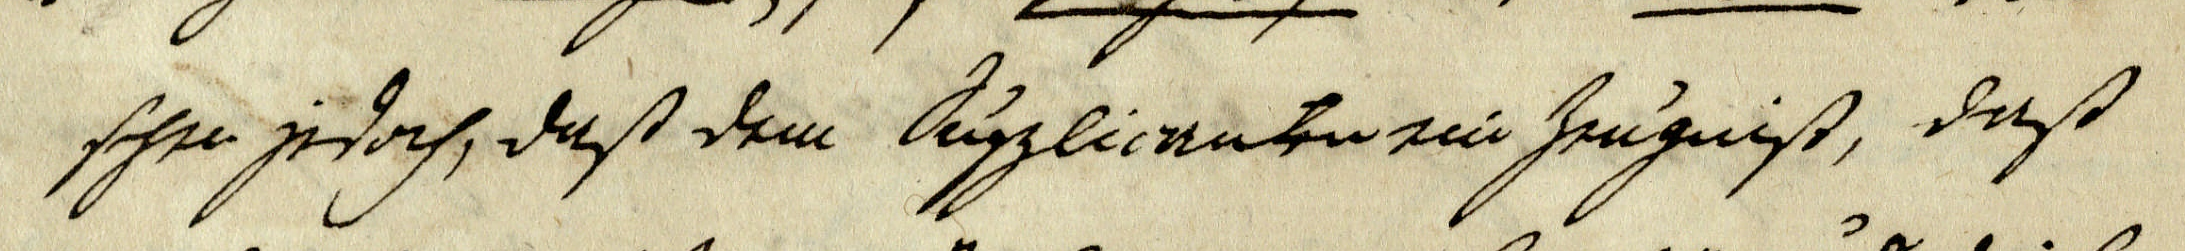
schen jedoch, daß dem Supplicanten ein Zeugniß, daß
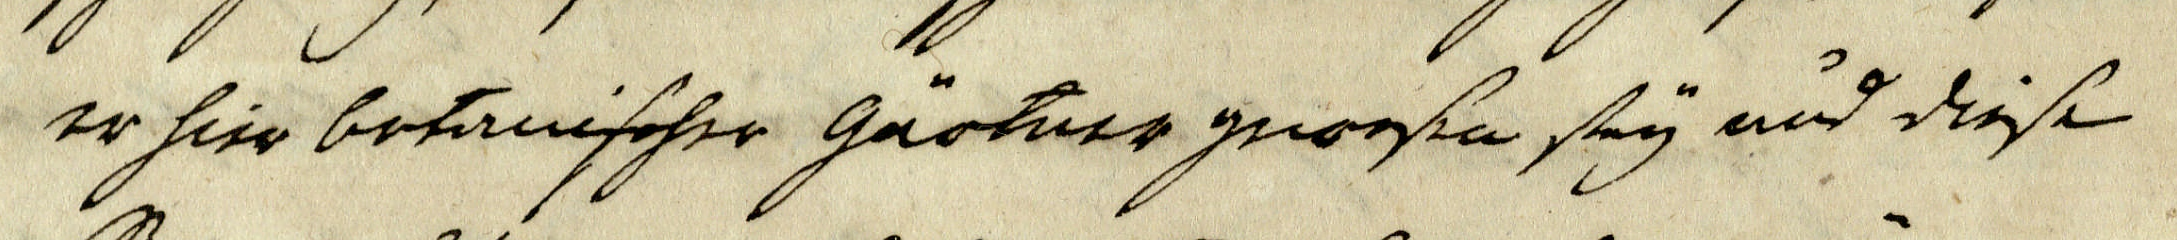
er hier botanischer Gärtner gewesen seÿ und diese
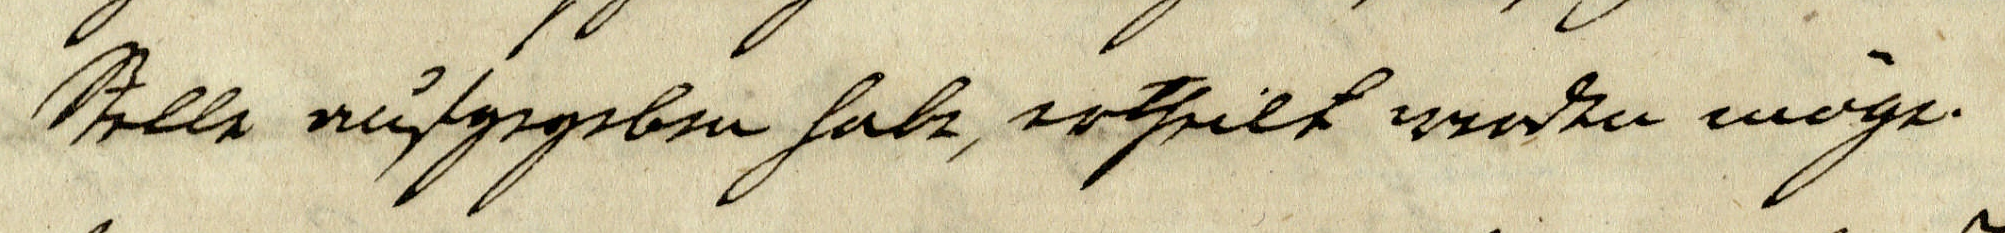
Stelle aufgegeben habe, ertheilt werden möge.
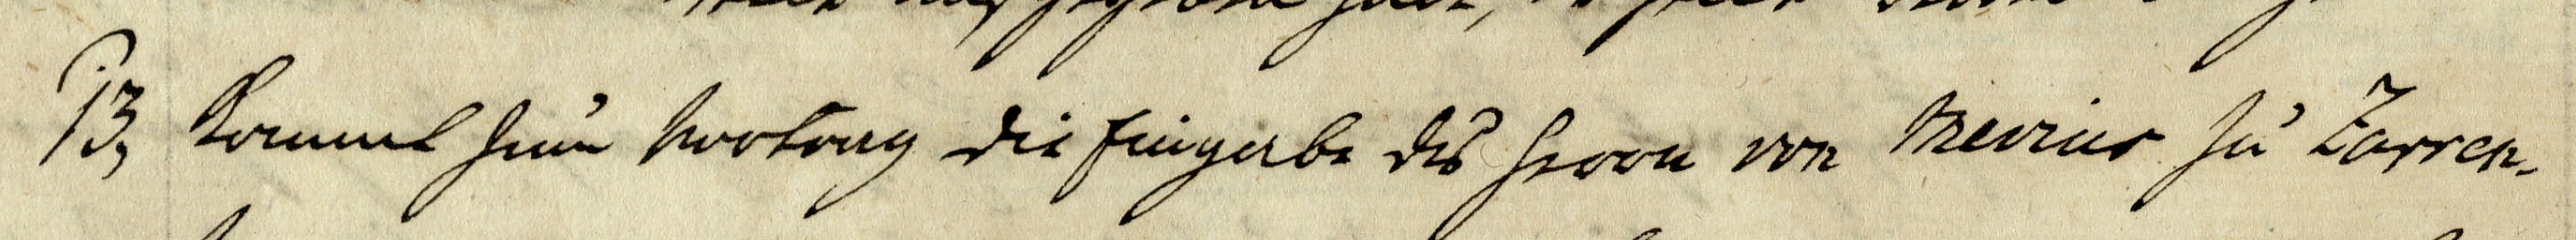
13. Kommt zum Vortrag die Eingabe des Herrn von Mevius zu Zarren¬
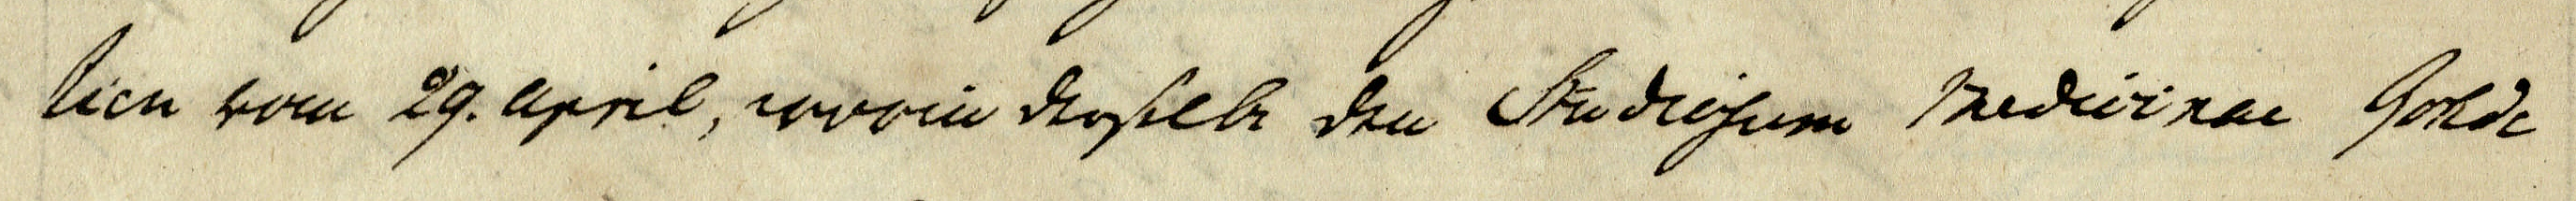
tien vom 29. April, worin derselbe den Studiosum Medicinae Rohde
